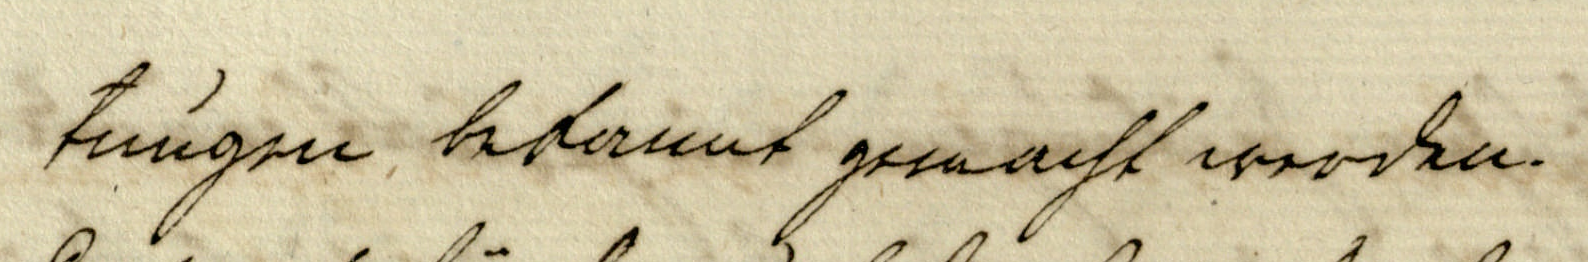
tungen bekannt gemacht werden.
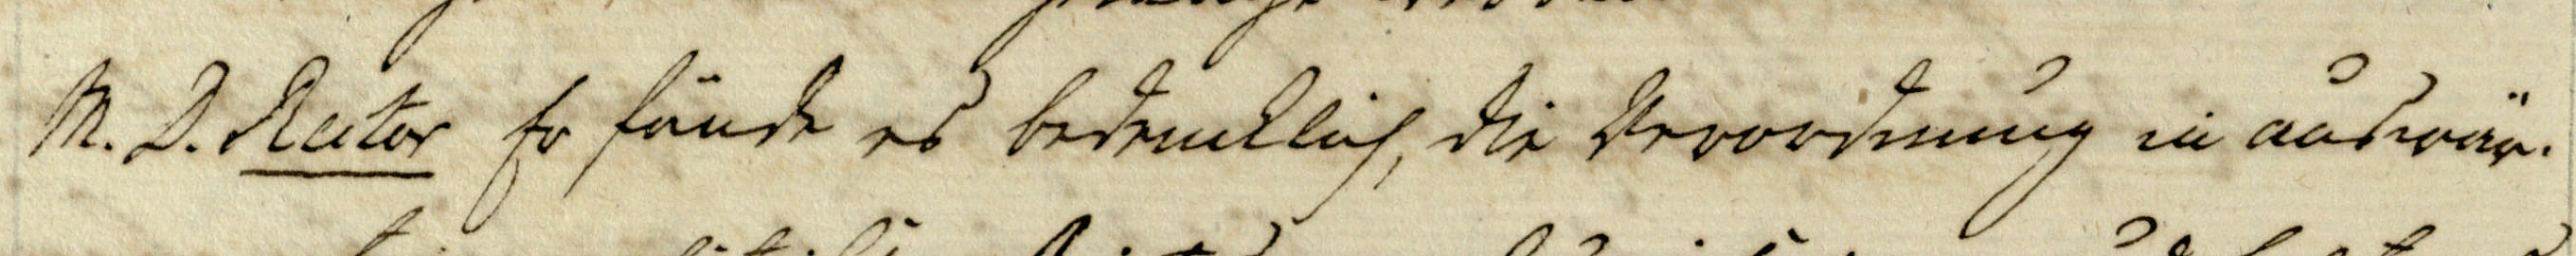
M. D. Rector Er fände es bedencklich, die Verordnung in answär¬
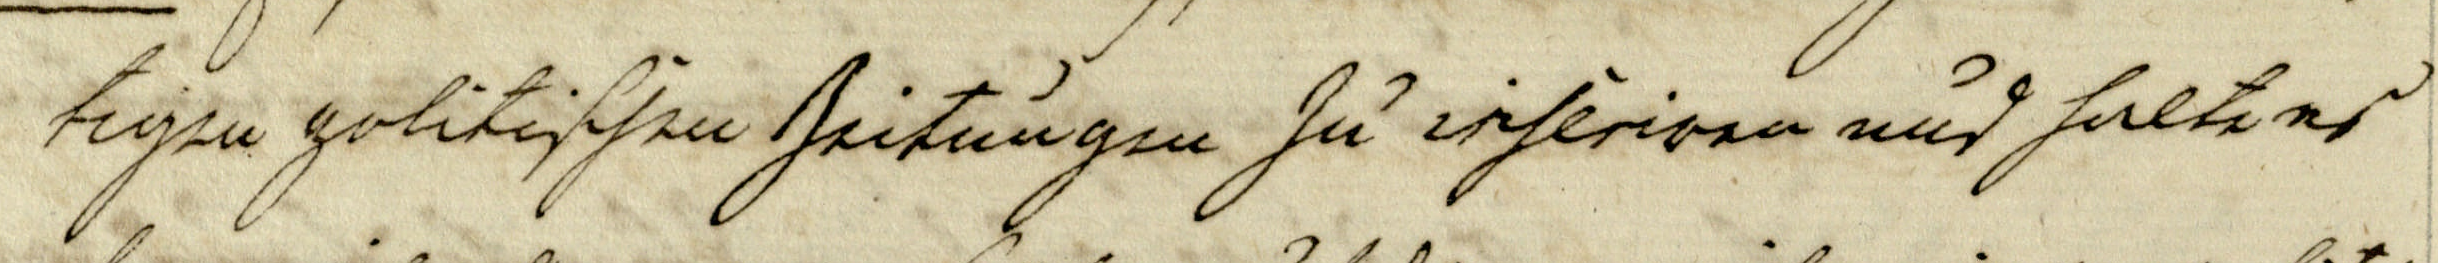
tigen politischen Zeitungen zu inseriren und halte es
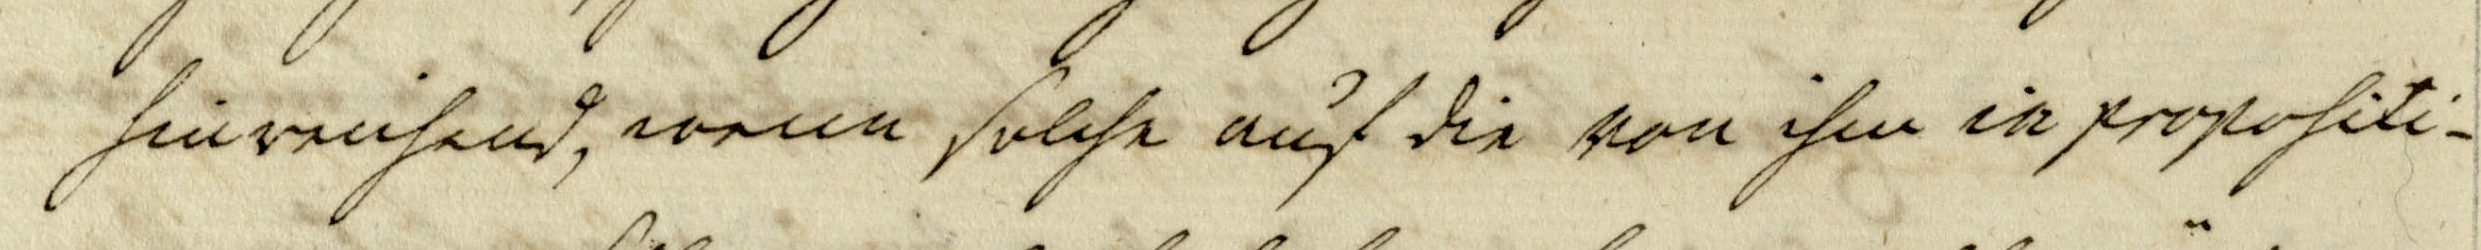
hinreichend, wenn solche auf die von ihm in propositi¬
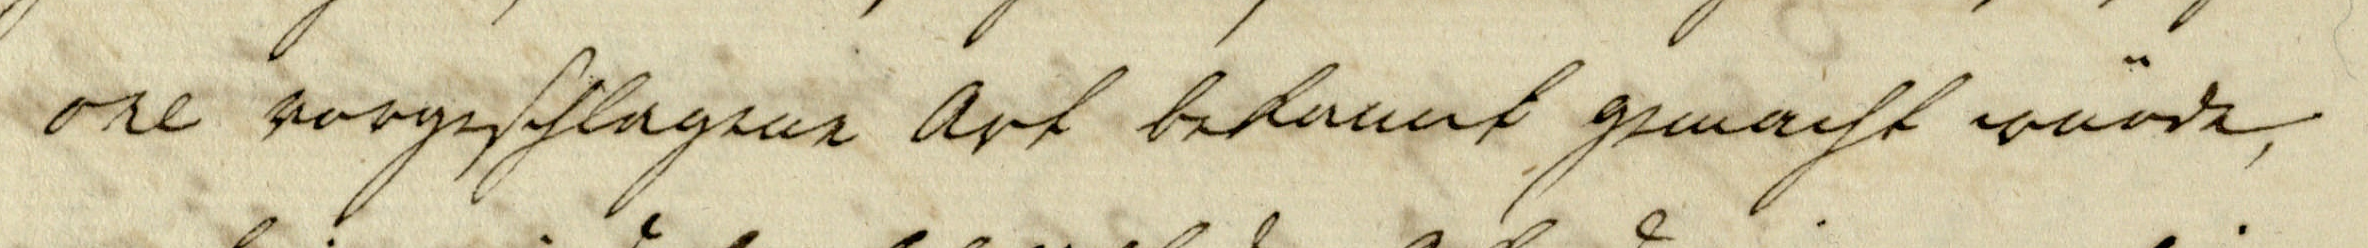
one vorgeschlagene Art bekannt gemacht würde,
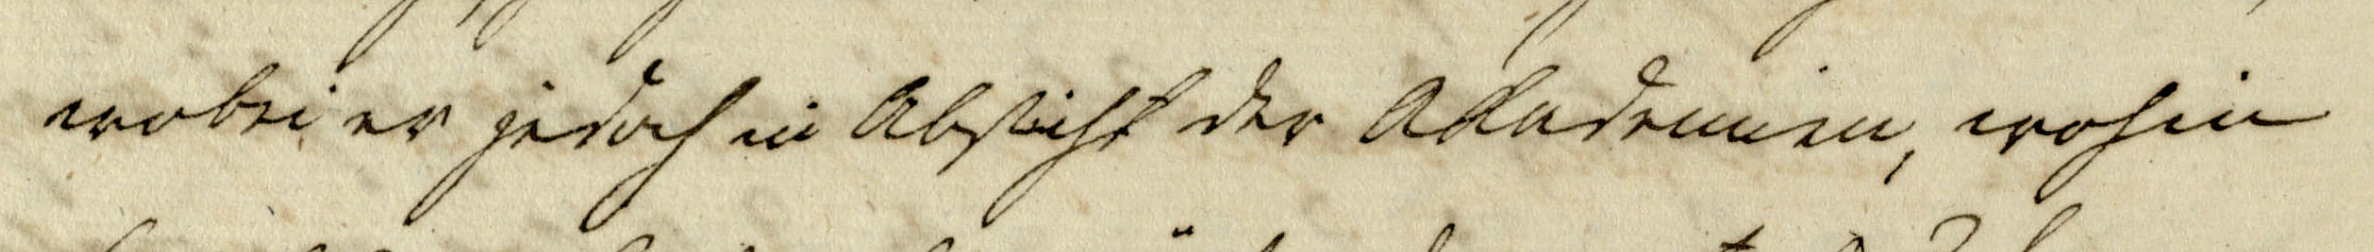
wobei er jedoch in Absicht der Akademien, wohin
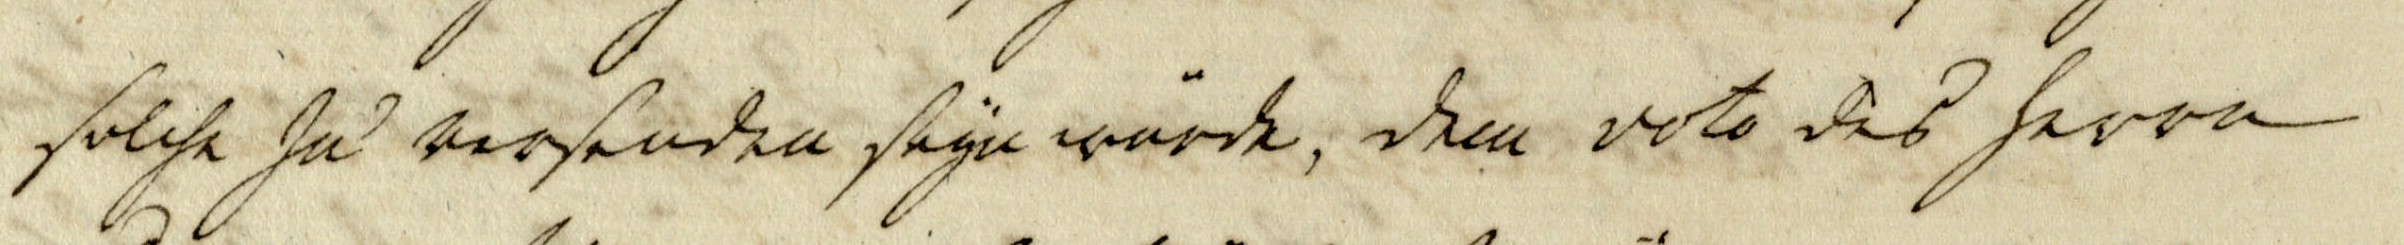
solche zu versenden seÿn würde, dem voto des Herrn
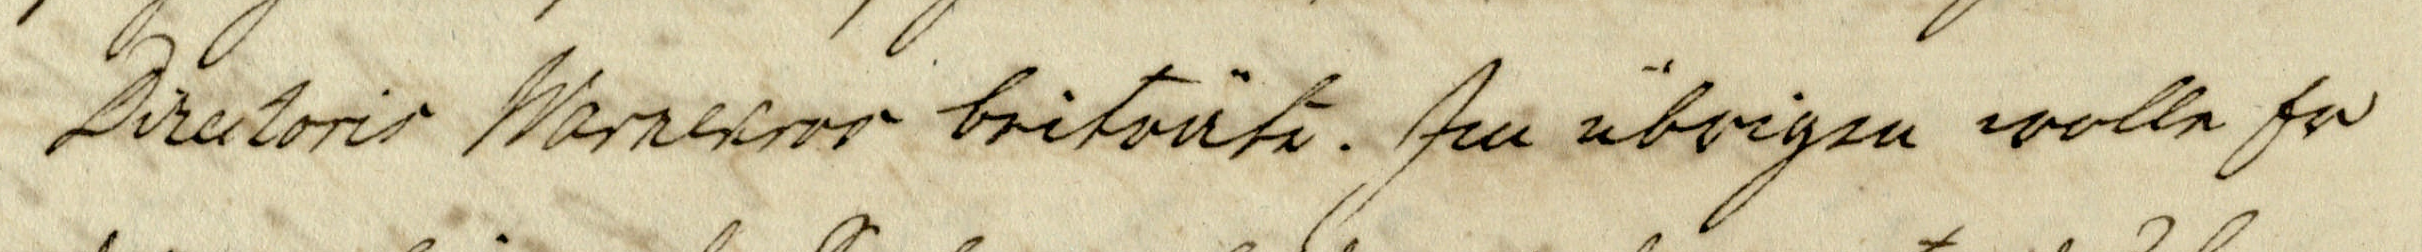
Directoris Warnekros beiträte. Im übrigen wolle Er
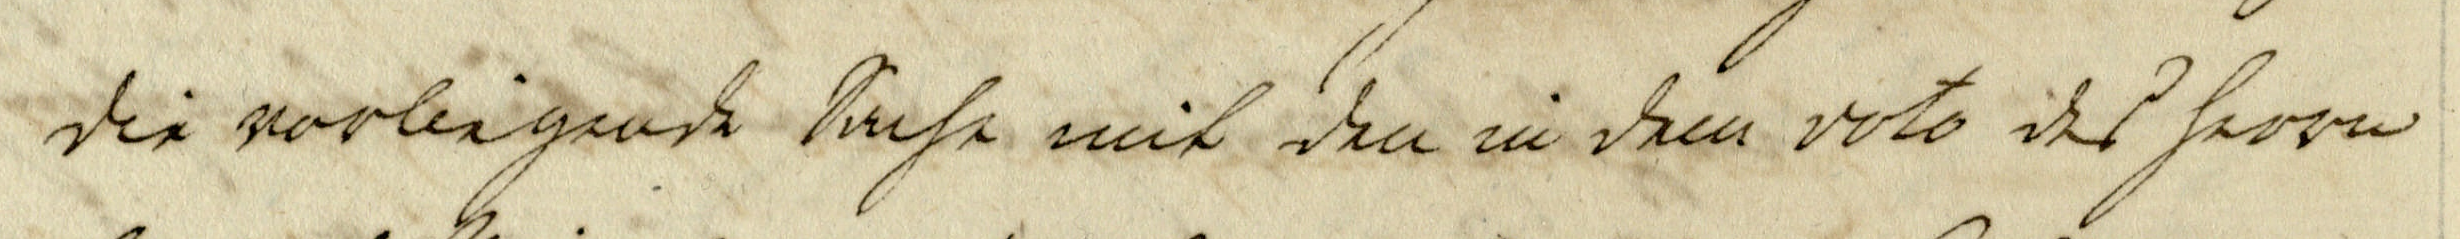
die vorliegende Sache mit den in dem voto des Herrn
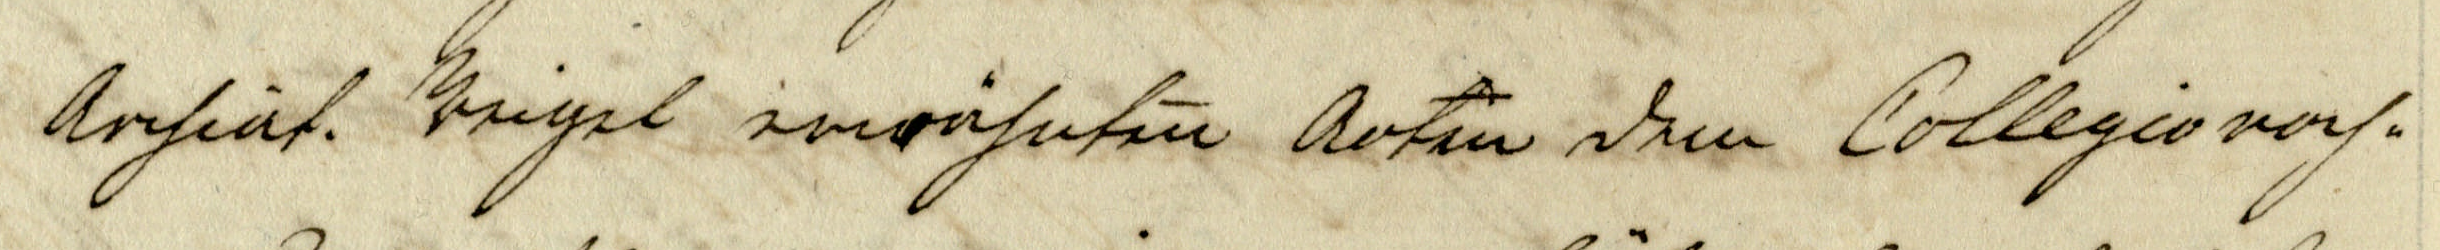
Archiat. Weigel erwähnten Acten dem Collegio noch¬
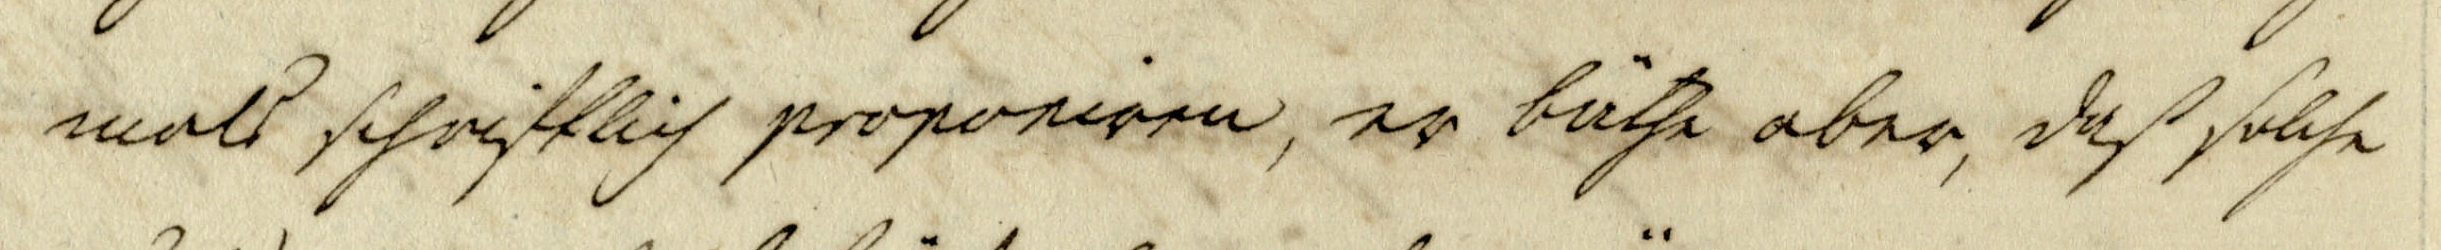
mals schriftlich proponiren, er bäthe aber, daß solche
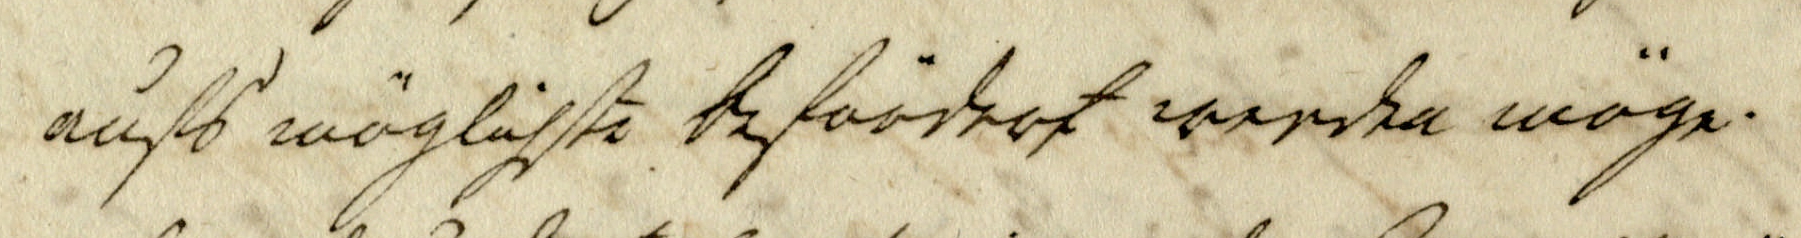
aufs möglichste befördert werden möge.
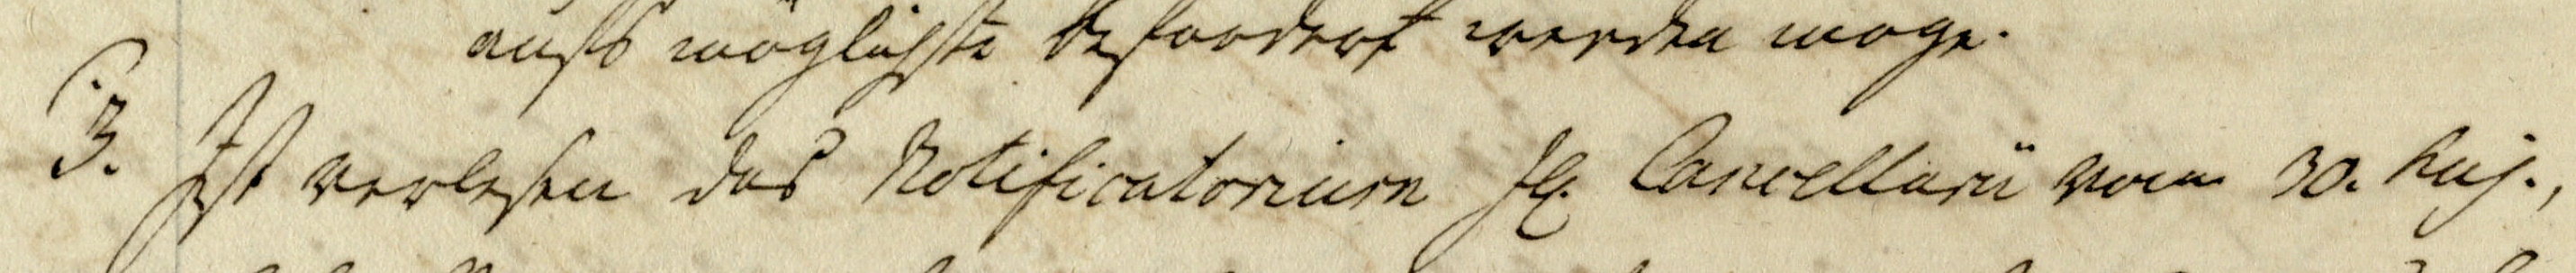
3. Ist verlesen das Notificatorium Ill. Cancellari vom 30. huj.,
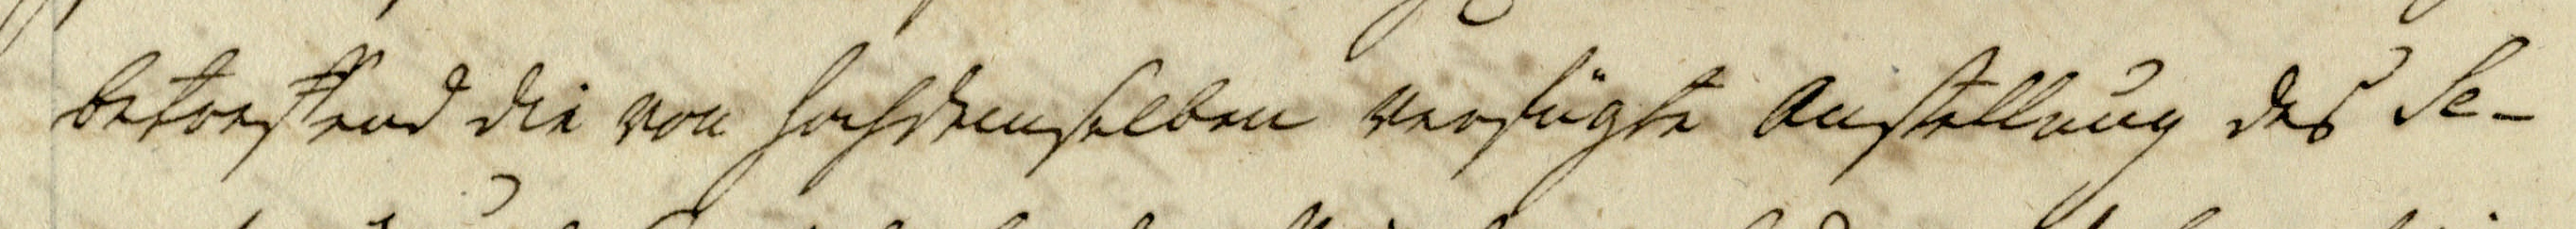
betreffend die von Hochdemselben verfügte Anstellung des Se¬
